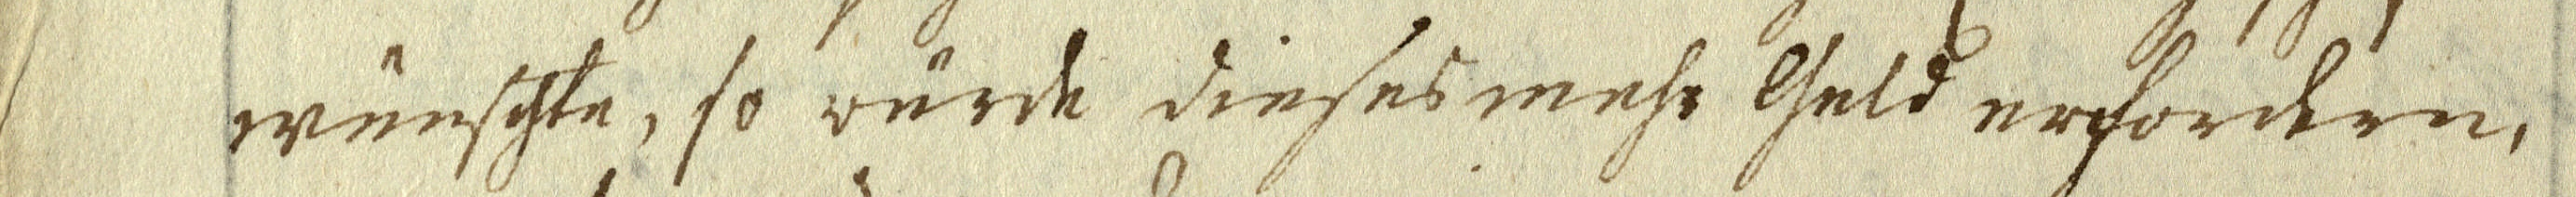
wünschte, so würde dieses mehr Geld erfordern,
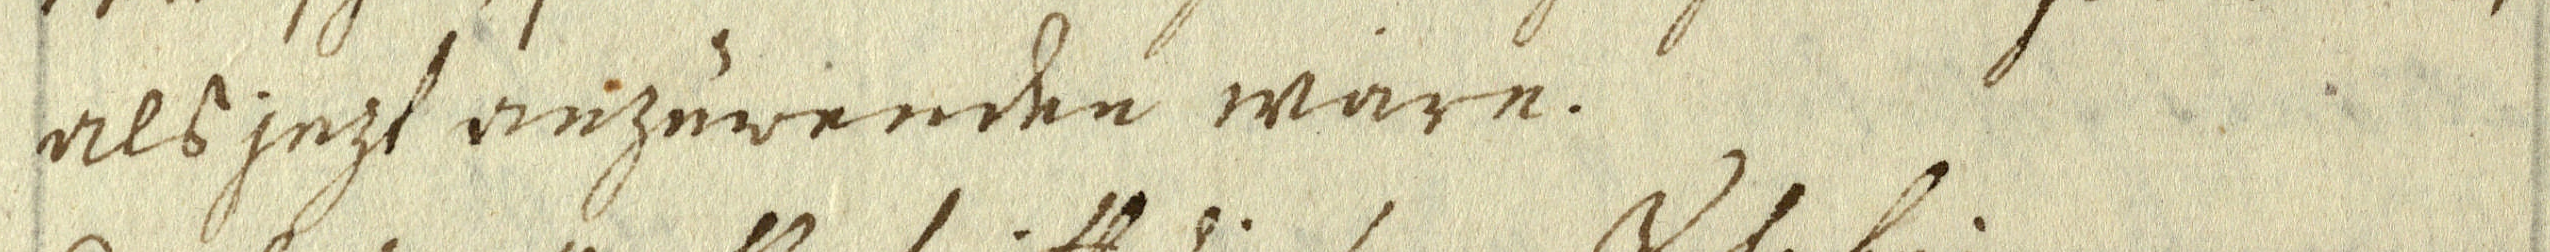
als jezt anzuwenden wäre.
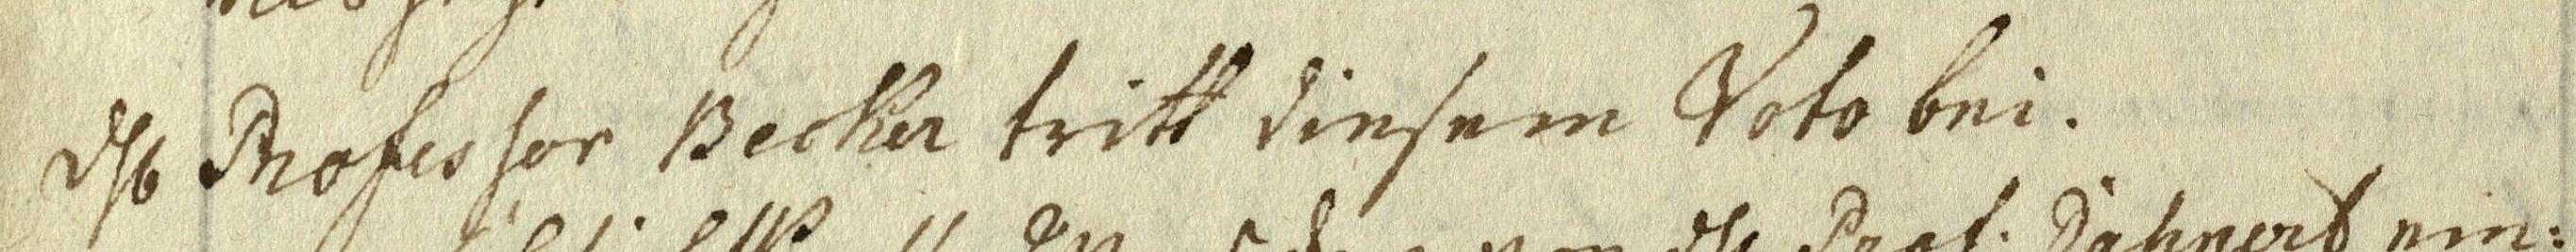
dh Professor Becker tritt diesem Voto bei.
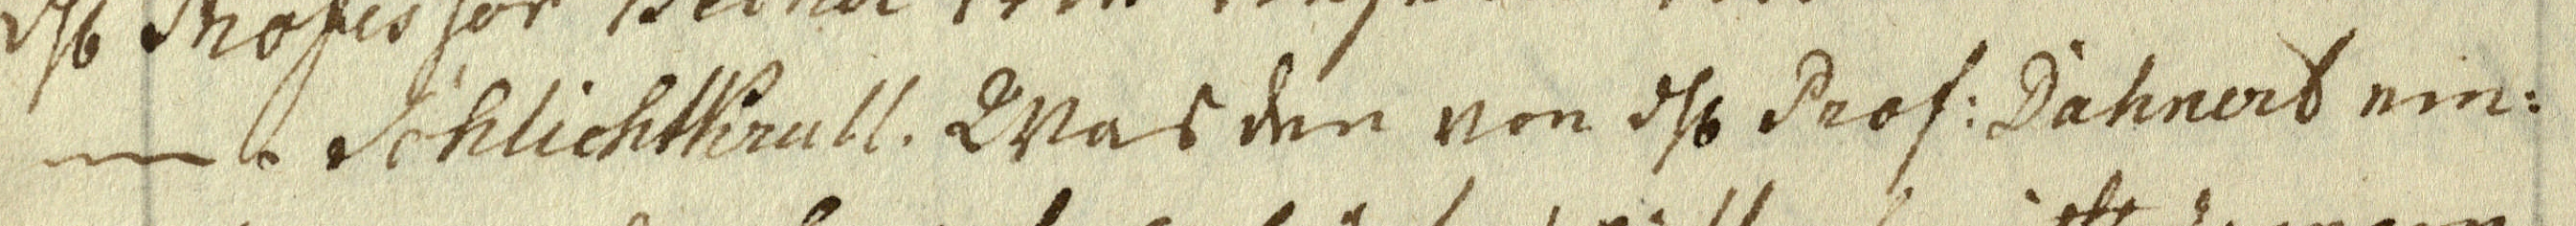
Schlichtkrull. Was den von dh Prof. Dähnert ein¬
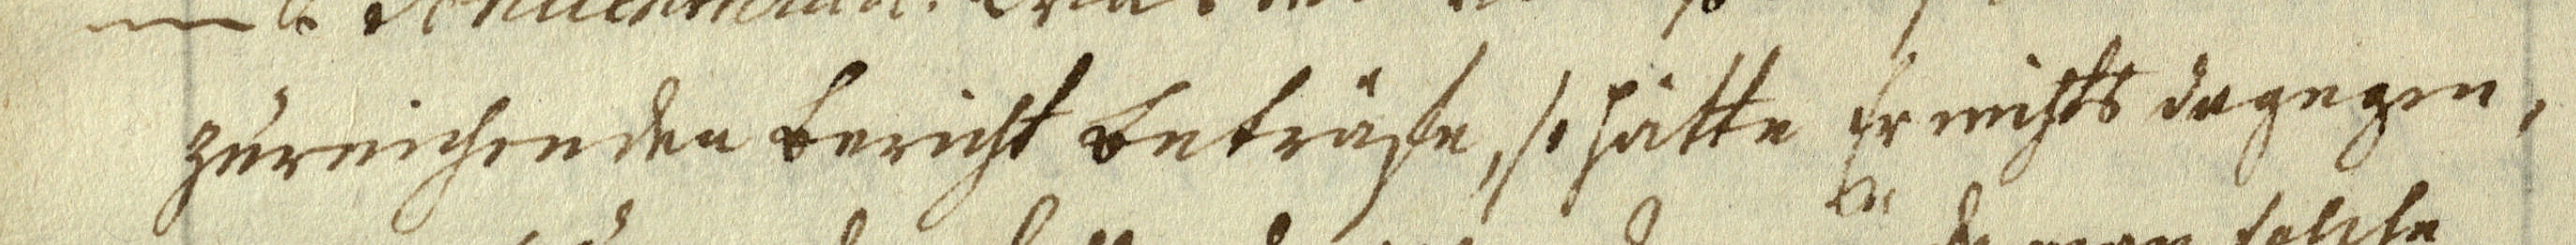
zureichenden Bericht beträfe, so hätte Er nichts dagegen,
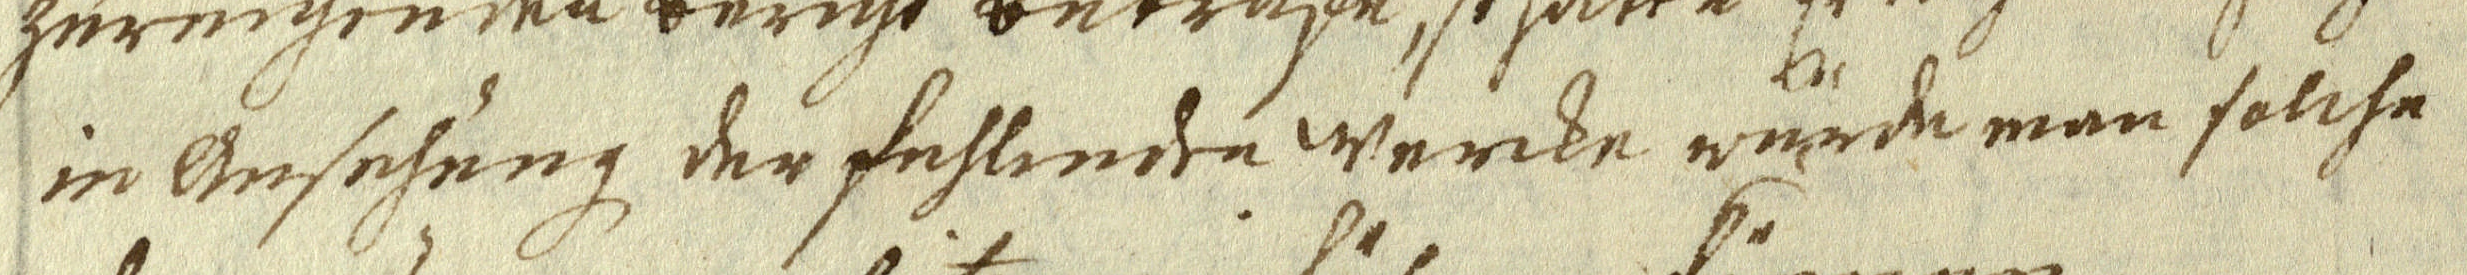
in Ansehung der fehlenden Wercke würde man solche
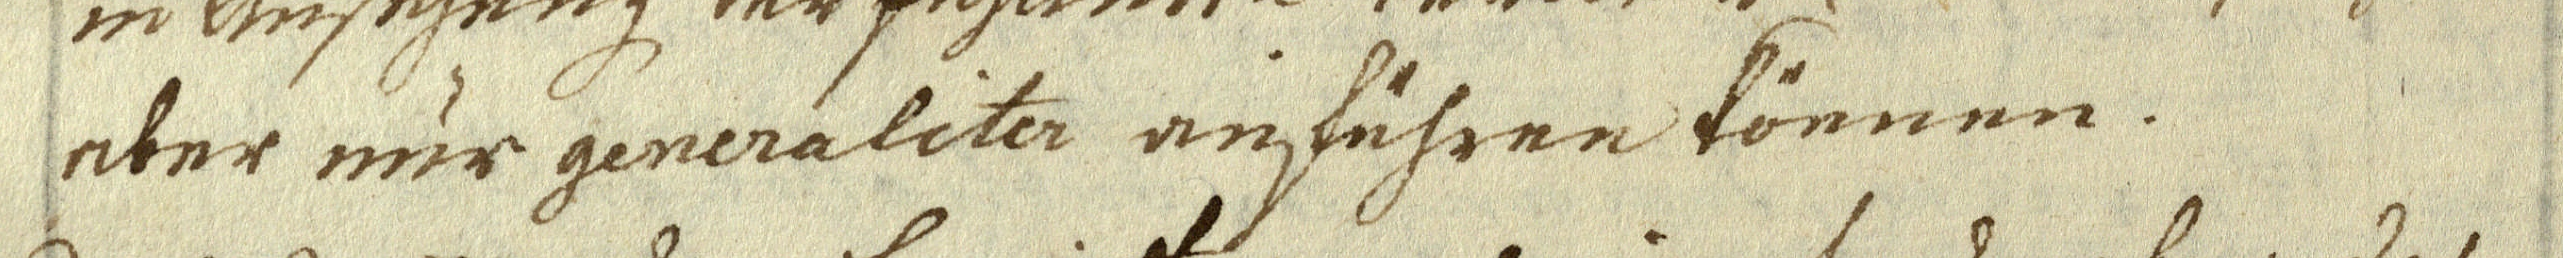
aber nur generaliter einführen können.
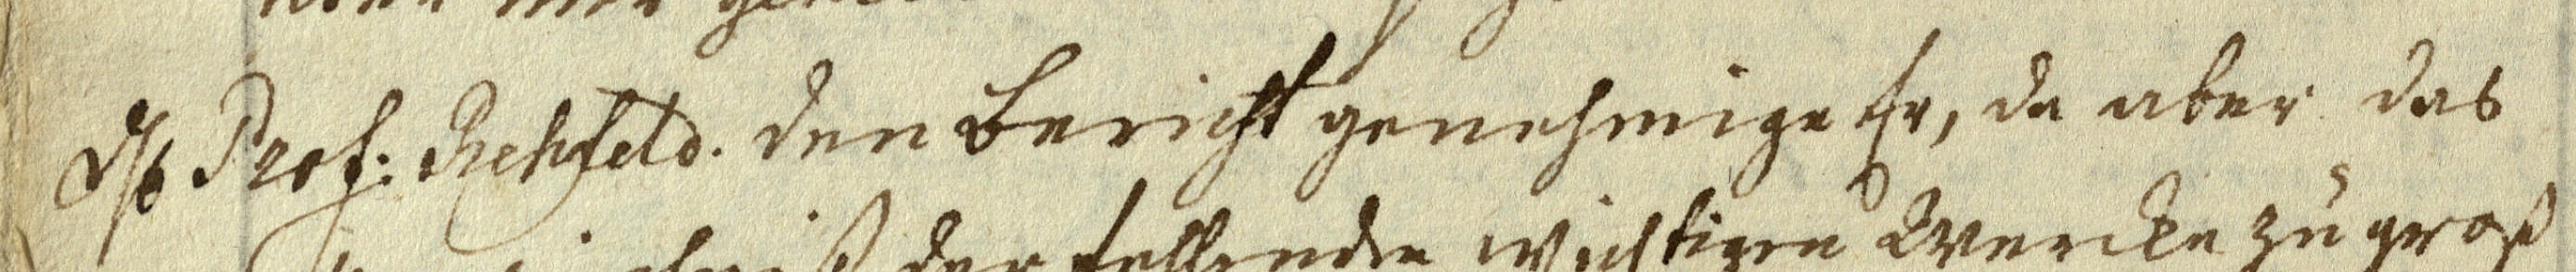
dh Prof: Rehfeld. den Bericht genehmige Er, da aber das
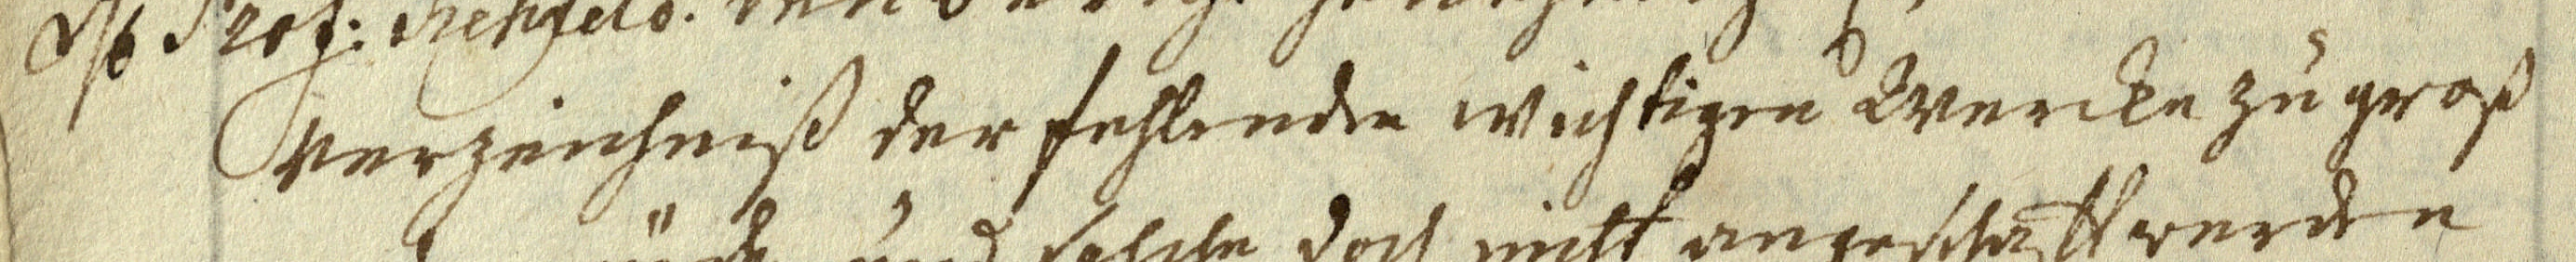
Verzeichniß der fehlenden wichtigen Wercke zu groß
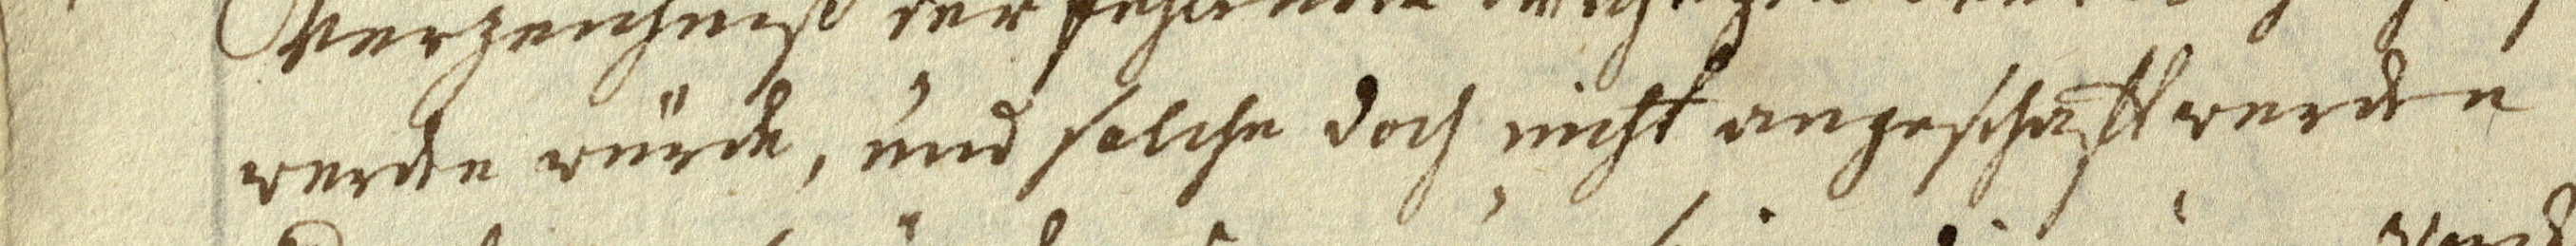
werden würde, und solche doch nicht angeschaft werden
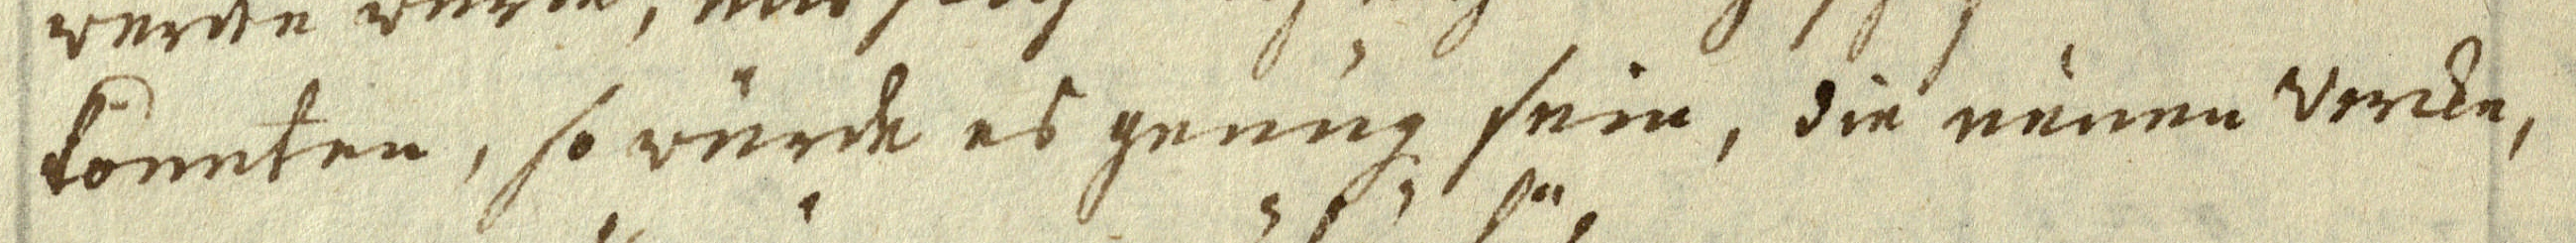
könnten, so würde es genug sein, die neuen Wercke,
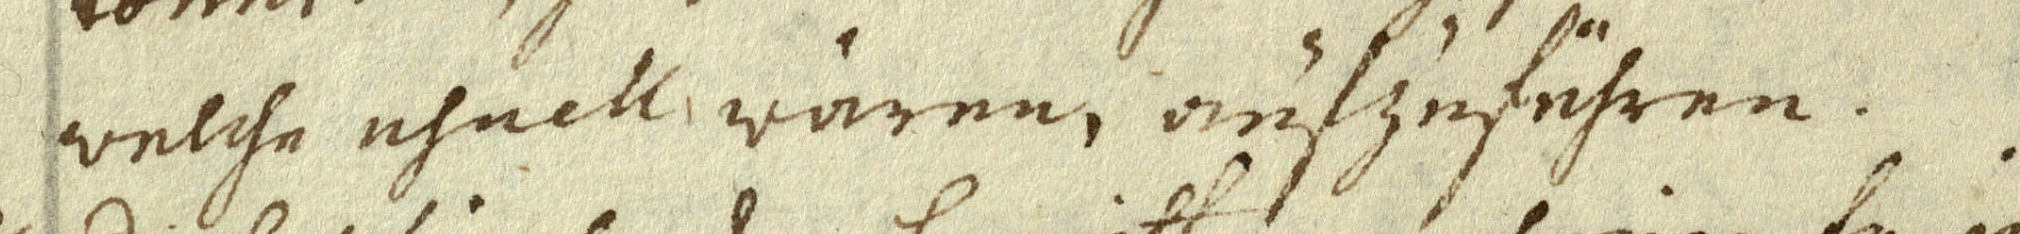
welche nhnett wären, aufzuführen.
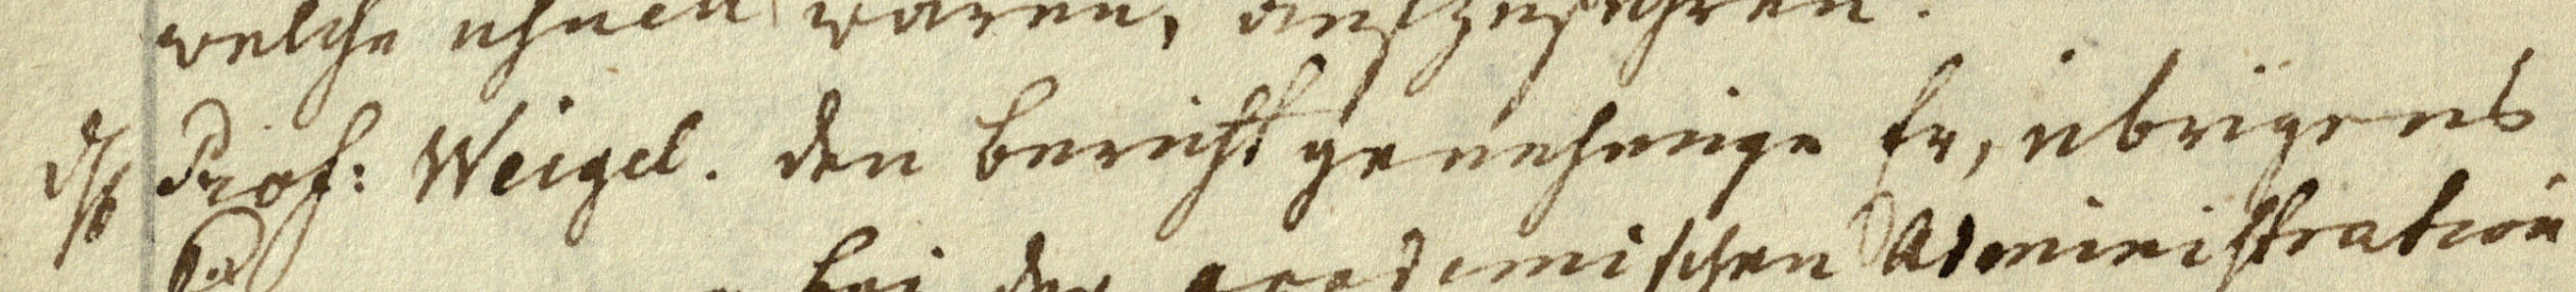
dh Prof: Weigel. den Bericht genehmige Er, übrigens
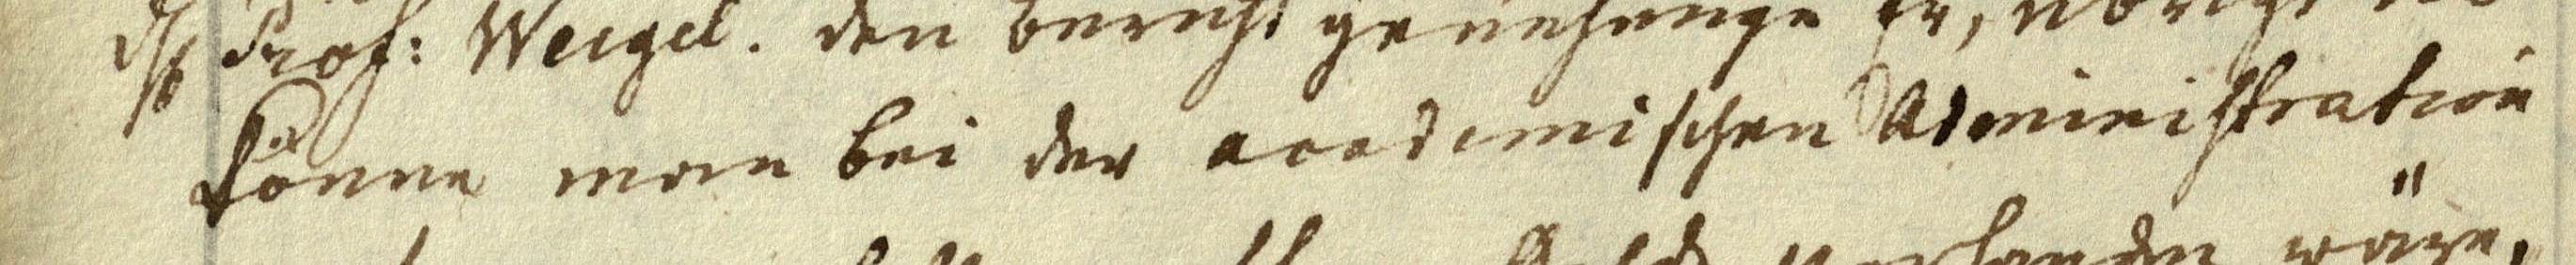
könne man bei der academischen Administration
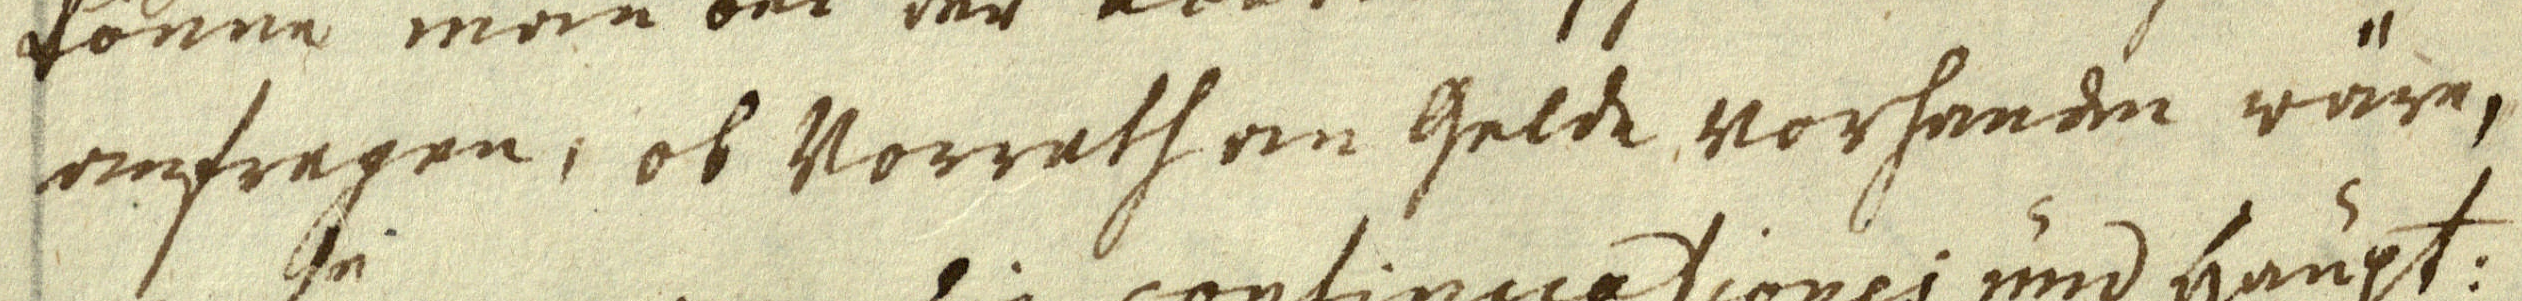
anfragen, ob Vorrath an Gelde vorhanden wäre,
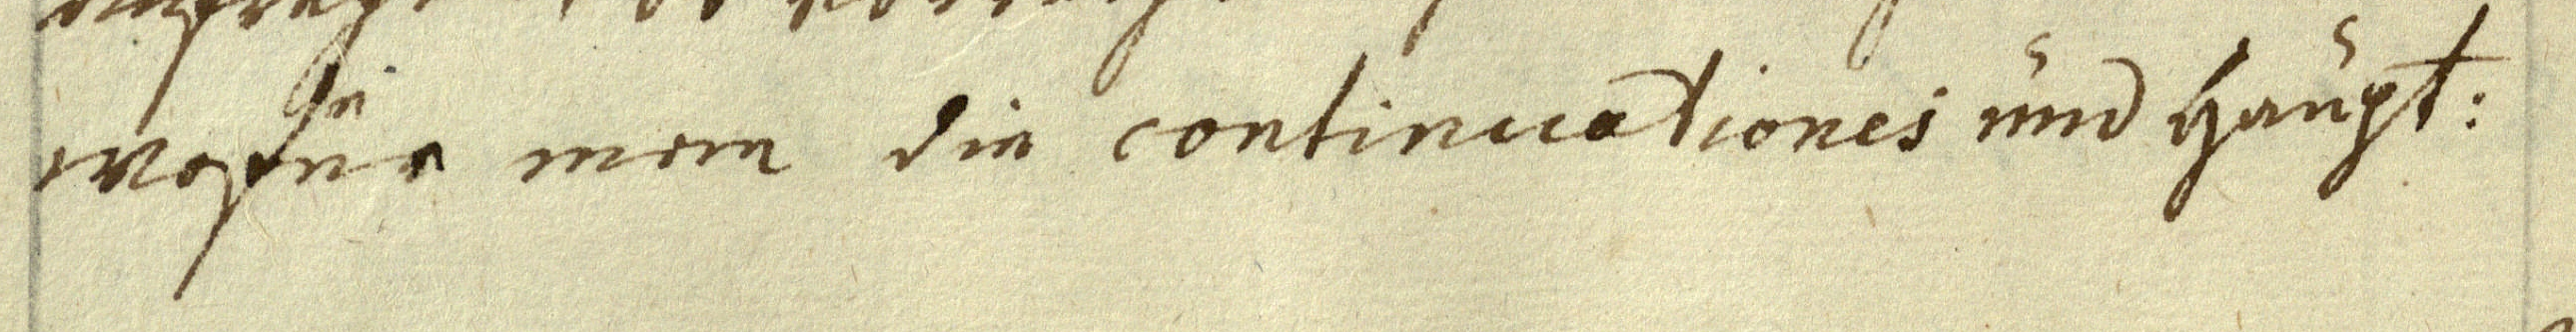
wofür man die continuationes und Haupt
